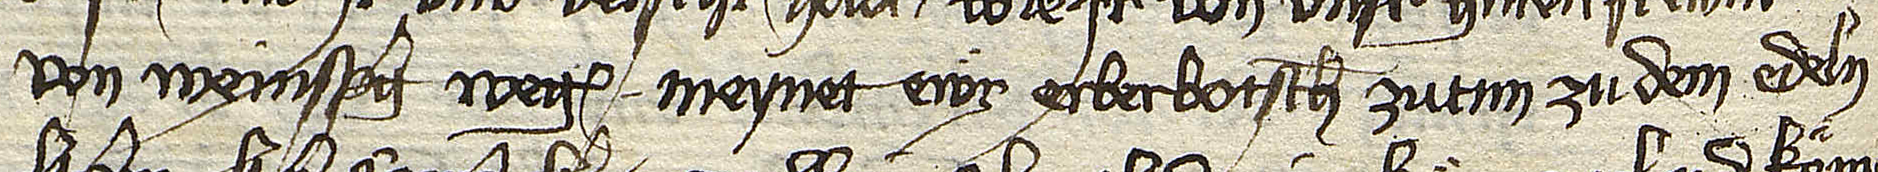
von weinſp*g weg* / meynet eẅr erber botſch* ʒutun ʒu dem edeln
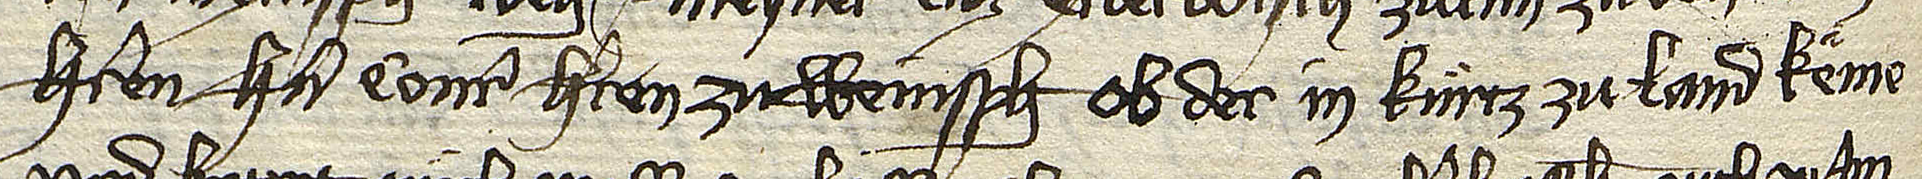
h*ren hn* Conr* h*ren ʒu Weinſp*g ob der in kürcʒ ʒu land këme
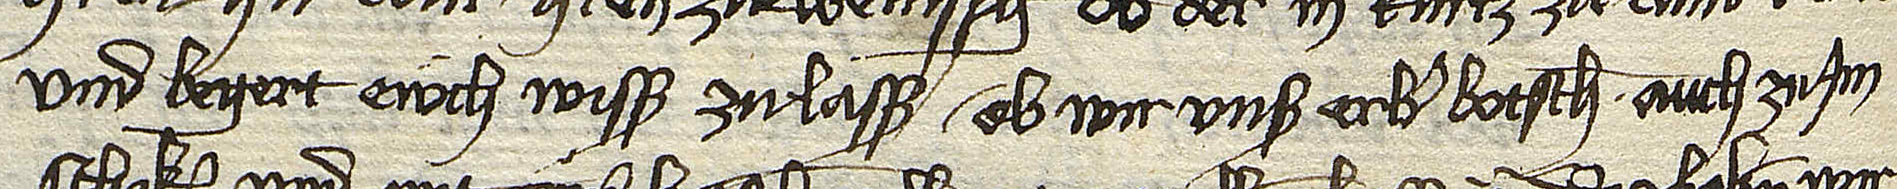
vnd begert eẅch wiſſ* ʒu laſſ* / ob wir vnſ* erb* botſch* . auch ʒu Im
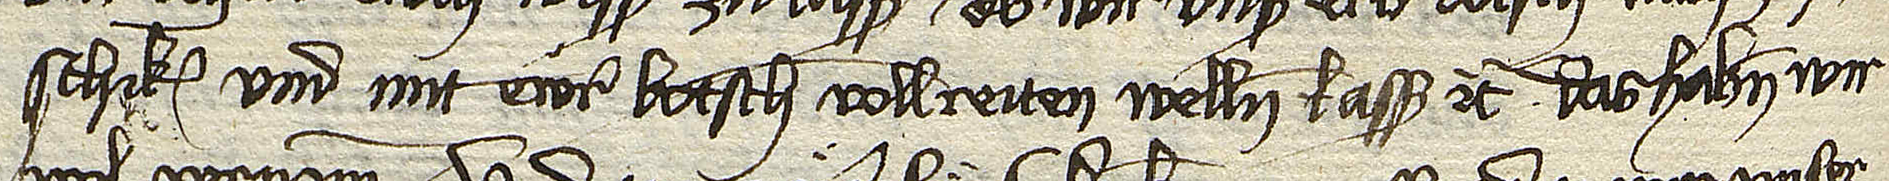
ſchik* vnd mit eẅr* botſch* vollreiten welln* laſſ* ec* . das habn* wir
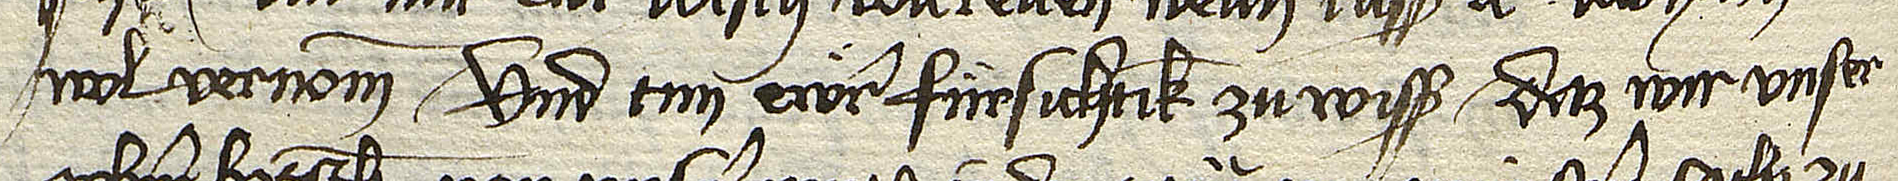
wol vernom* / Vnd tun eẅr* fürſichtik* ʒu wiſſ* / daʒ wir vnſer
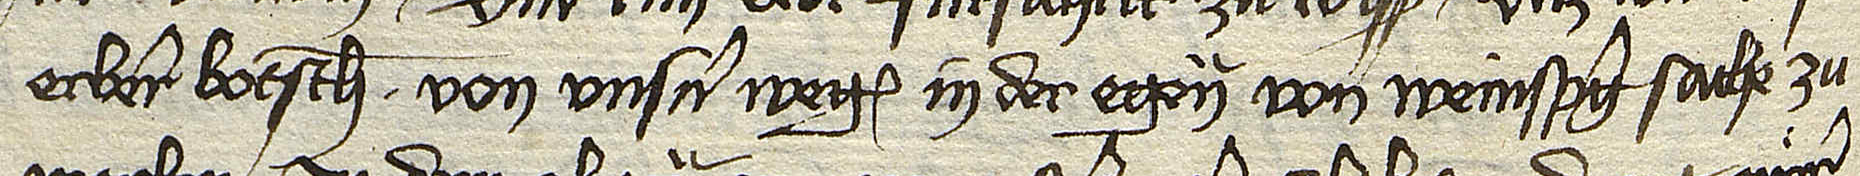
erber* botſch* / von vnſn* weg* in der egen* von weinſp*g ſache ʒu
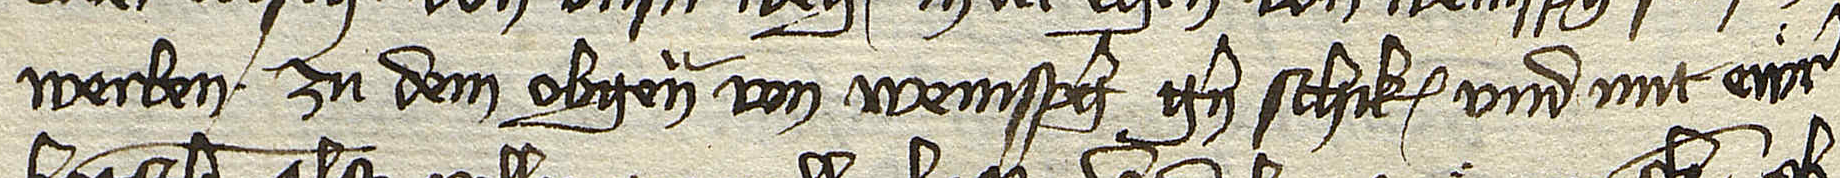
werben . ʒu dem obgen* von weinſp*g g*n ſchik* vnd mit eẅr*
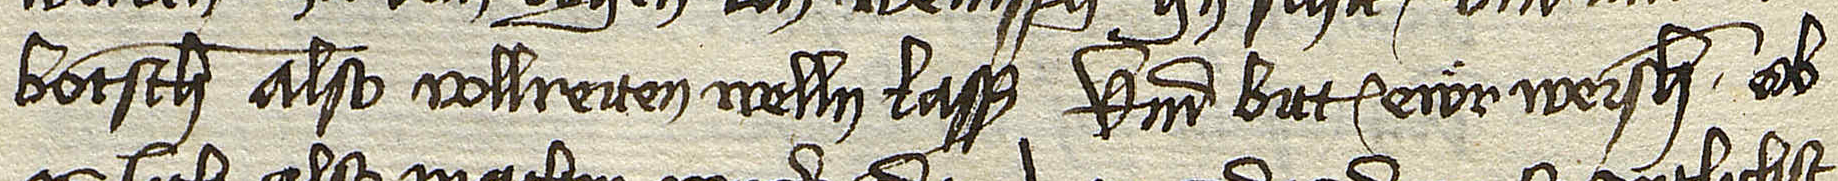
botſch* alſo vollreiten welln laſſ* Vnd bitt* eẅr weiſh* / Ob
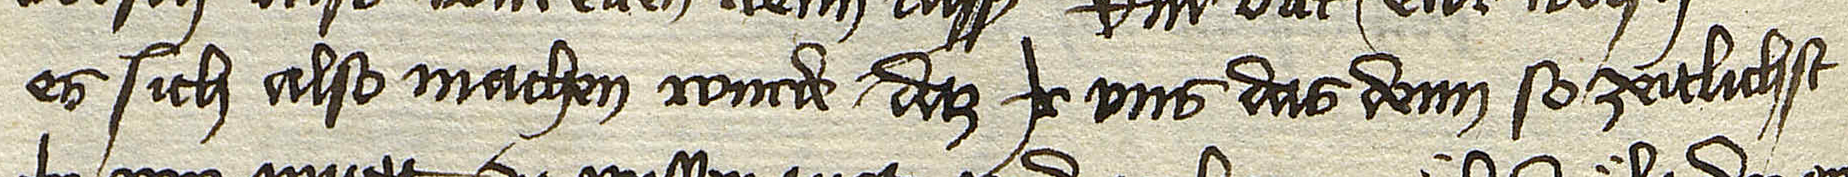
es ſich alſo machen wurde / daʒ Ir vns das denn ſo ʒeitlichſt
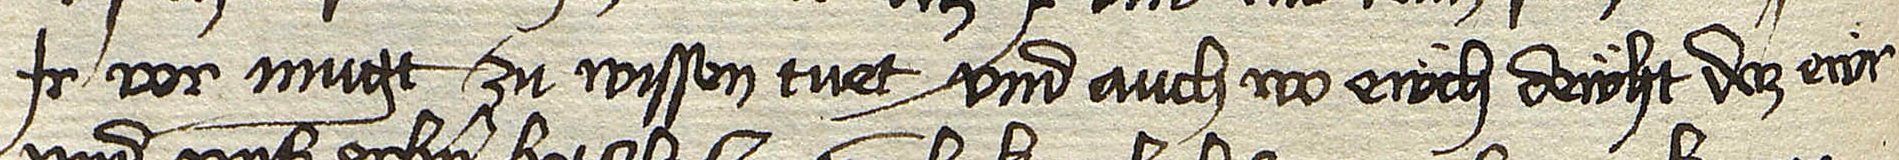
Ir vor mugt / ʒu wiſſen tuet vnd auch wo eẅch deẅht daʒ eẅr
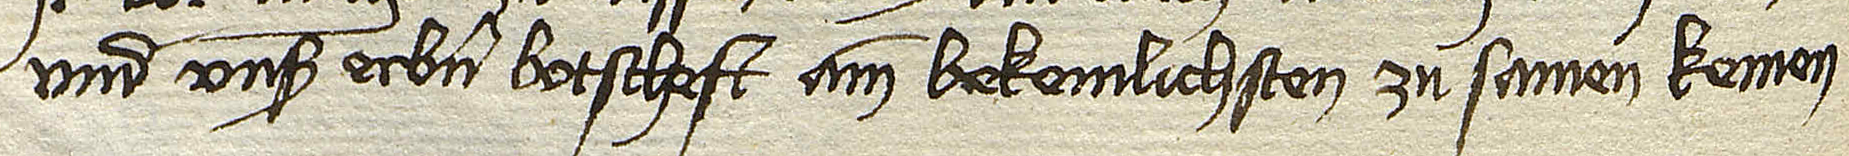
vnd vnſ* erbn* botſcheft am* bekemlichſten ʒu ſamen kemen
